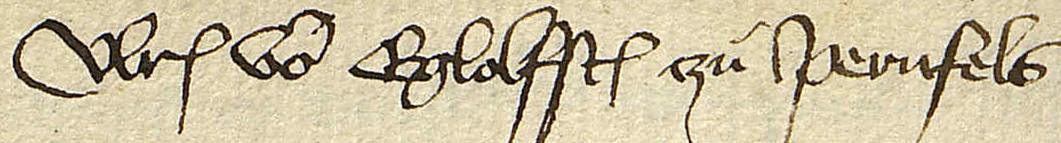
vlr* vo* Eglolfſt* cʒü Pernfels
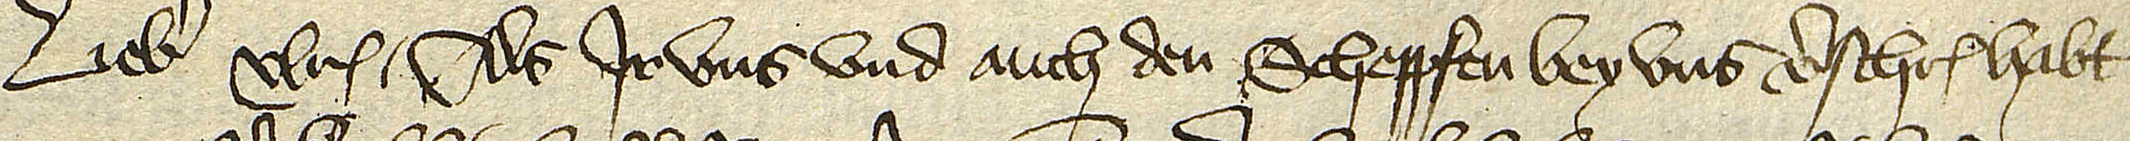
Lieb* vlr* / Als Ir vns vnd auch den Scheppfen bey vns v*ſchr* habt
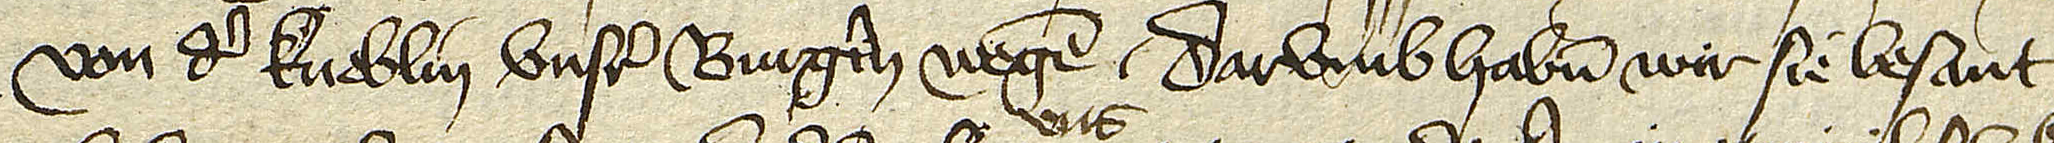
von d* küeblin vnſr* Burg*in wege* / Darvmb habn* wir ſie beſant
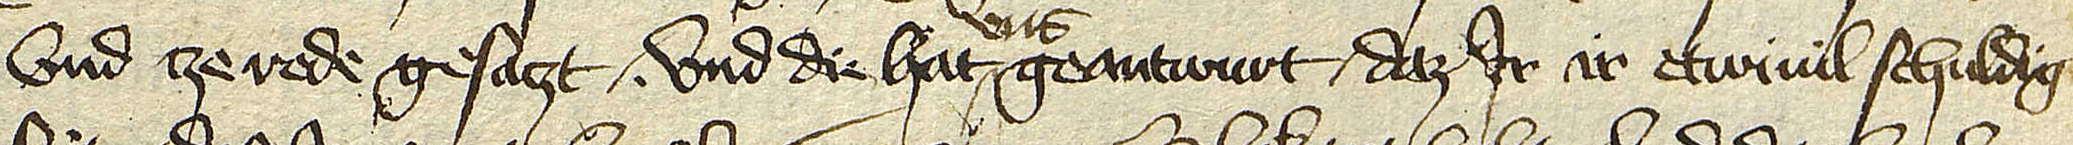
vnd cʒe rede geſacʒt / . vnd die hat geantwurt / daʒ Ir ir etwiuil ſchuldig
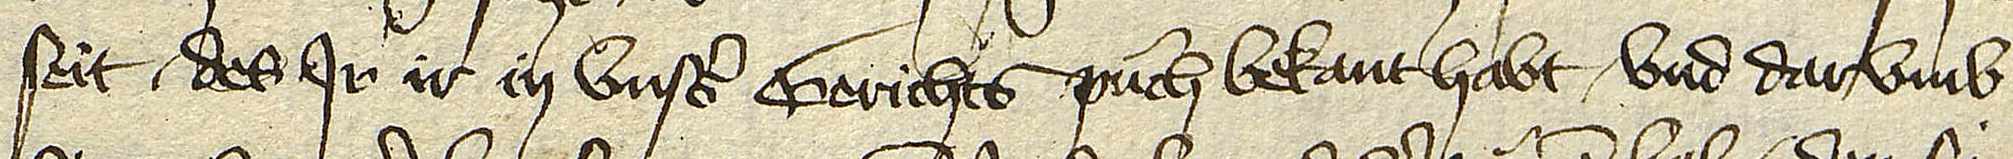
ſeit / des Ir ir in vnſs* Gerichts püch bekant habt / vnd darvmb
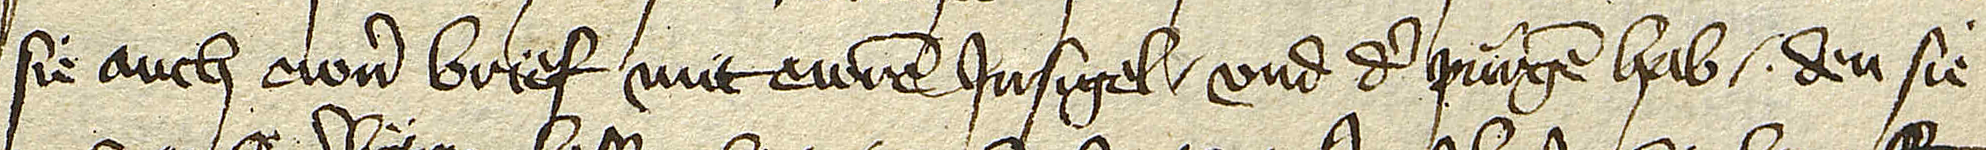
ſie auch ewn* brief mit ewre* Inſigel / vnd d* pürge* hab / . den ſie
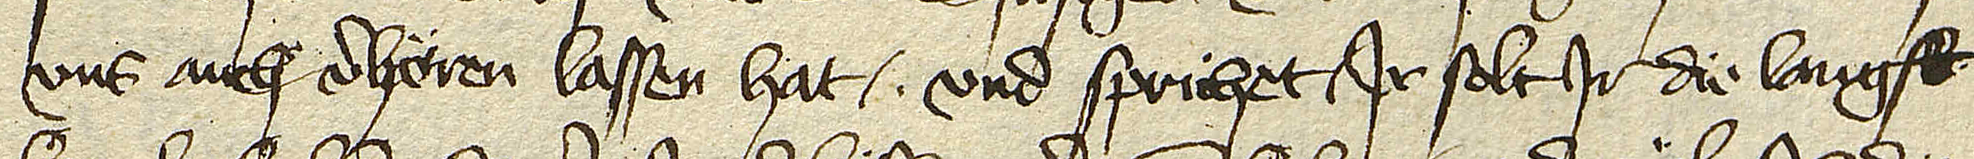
vns auch v*hören laſſen hat / . vnd ſprichet / Ir ſolt Ir die lang%%
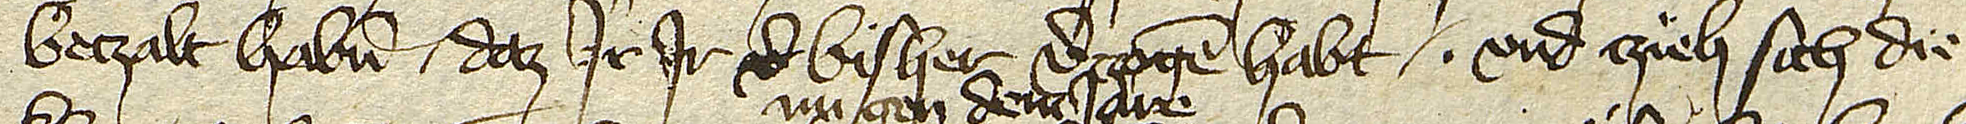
becʒalt habn* / daʒ Ir Ir v* biſher v*cʒoge* habt / . vnd cʒieh ſich die
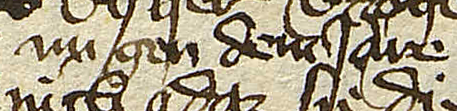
nu gen dem Iare
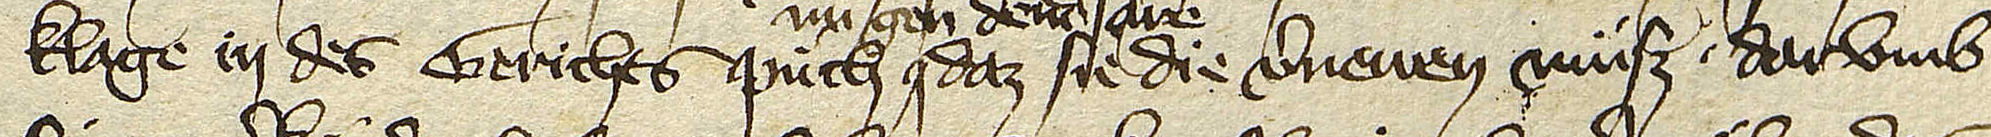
klage in des Gerichts püch / daʒ ſie die v*newen müſʒ / darvmb
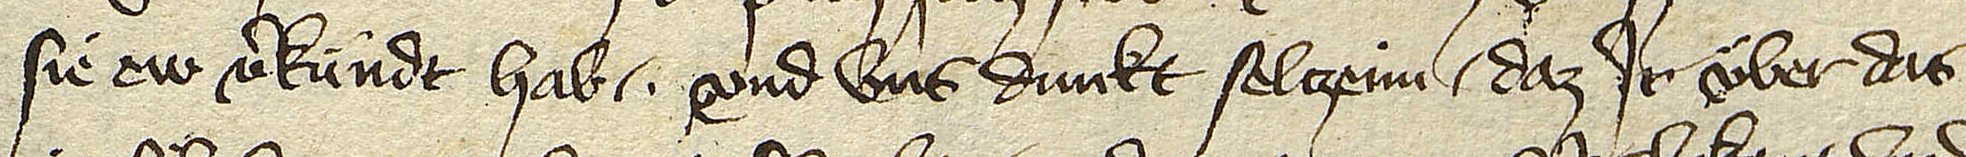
ſie ew v*kündt hab / . vnd vns dunkt ſelcʒeim / daʒ Ir v̈ber das
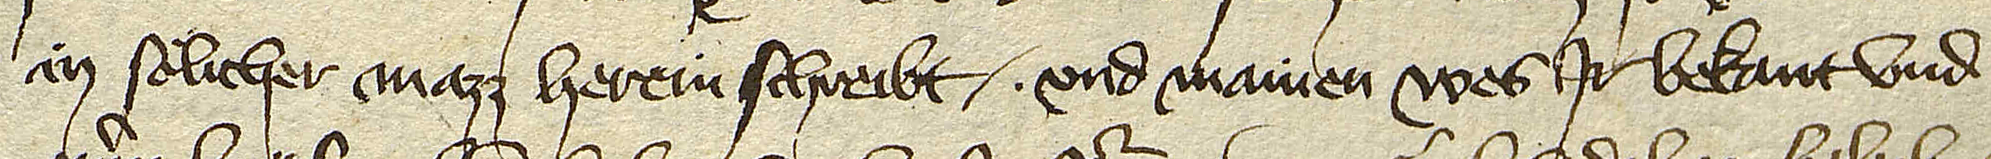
in ſölicher maʒʒ herein ſchreibt / . vnd mainen wes Ir bekant vnd
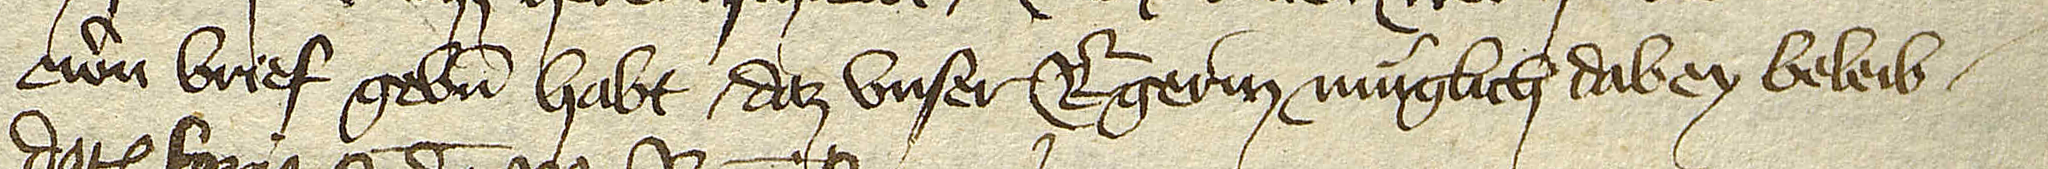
ew*n brief gebn* habt / daʒ vnſer B*gerin müglich dabey beleib /
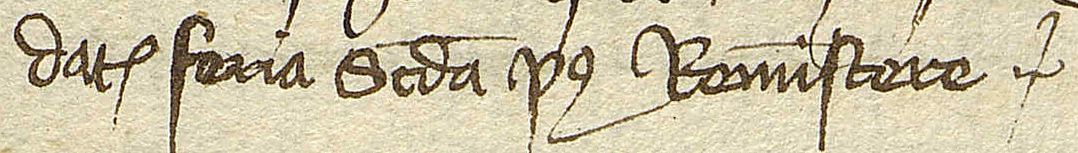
dat* feria Scda* p* Remiſcere %
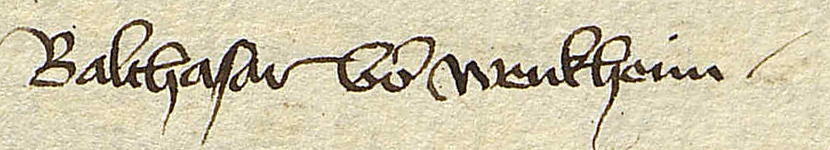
Balthaſar vo* Wenkheim /
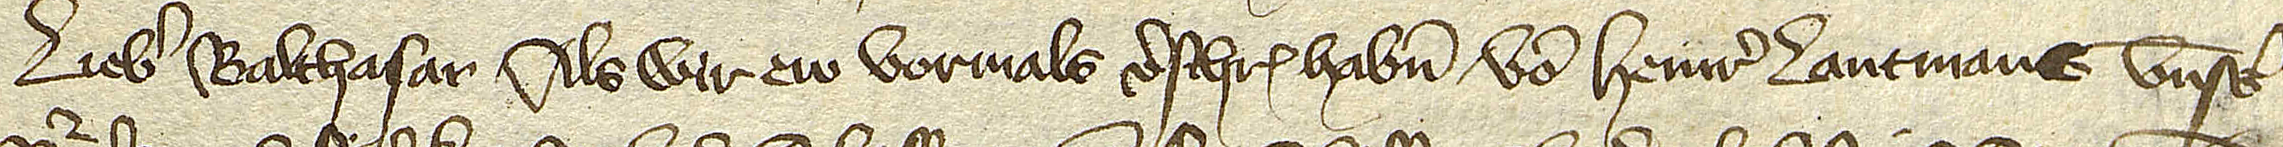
Lieb* Balthaſar / Als wir ew vormals v*ſchr* habn* vo* heinr* Lantmans vnſs*
